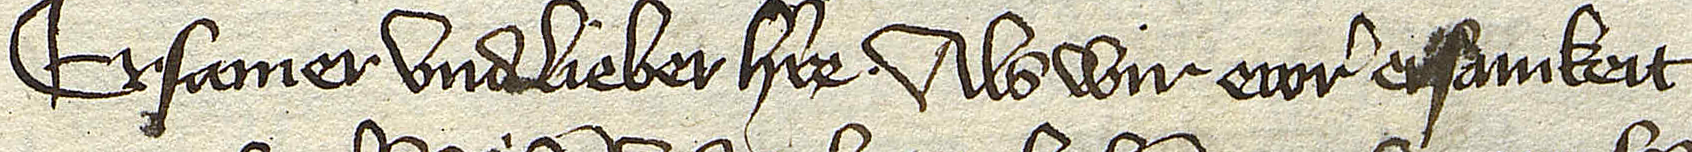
Erſamer vnd lieber hre* . Als wir ewr* erſamkeit
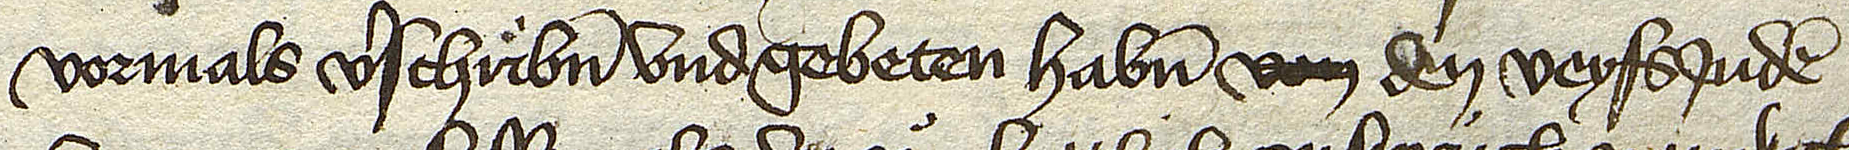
vormals vſchribn* vnd gebeten habn* von den veyfsIude*
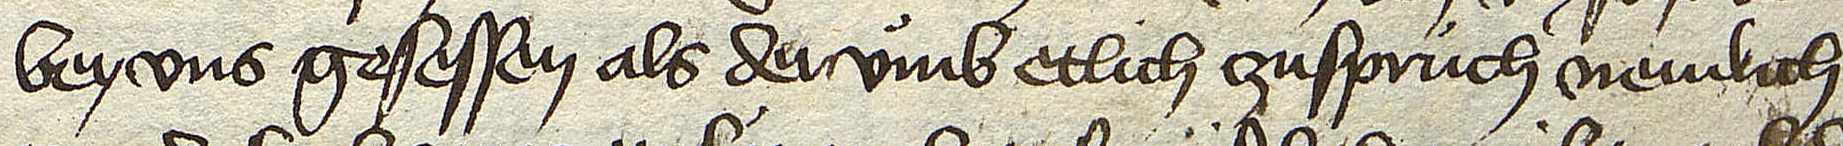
bey vns geſeſſen als der v̈mb etlich cʒuſprüch nemlich
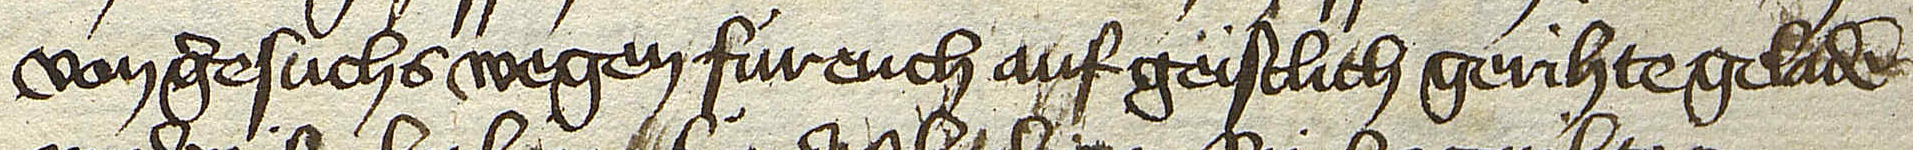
von geſuchs wegen für euch auf geiſtlich gerihte gelade*
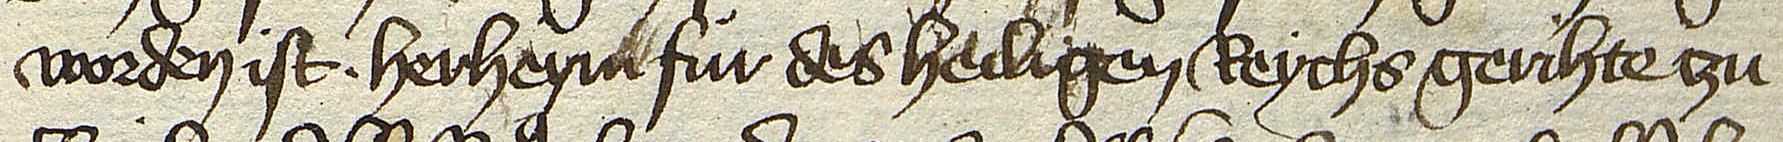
worden iſt . herheym für des heiligen Reychs gerihte cʒu
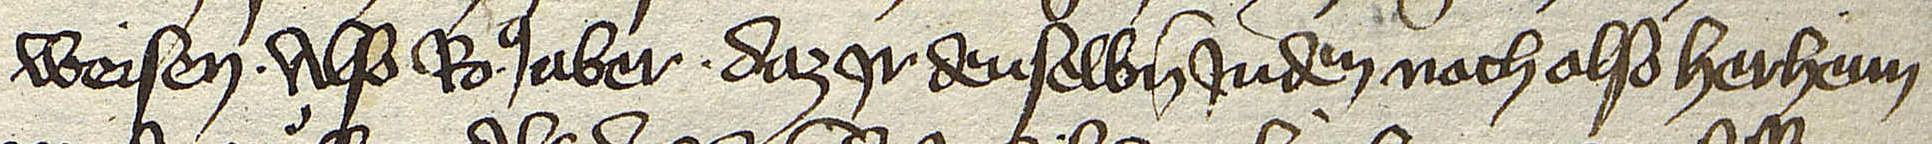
weiſen . Alſo Ro* aber . daʒ Ir denſelbn* Iuden noch alſo herheim
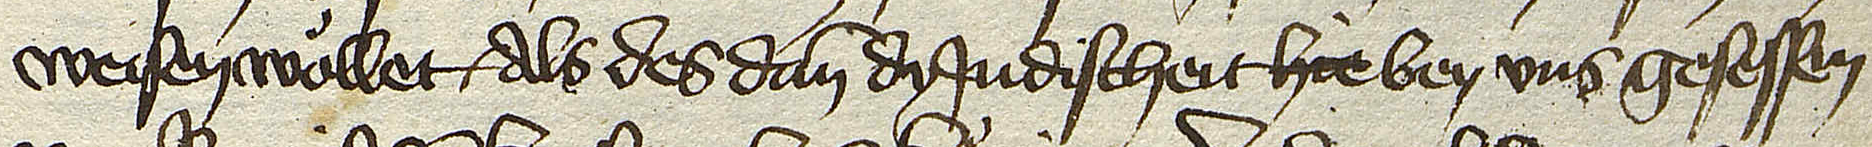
weiſen wöllet / Als des dan* dy Iudiſcheit hie bey vns geſeſſen
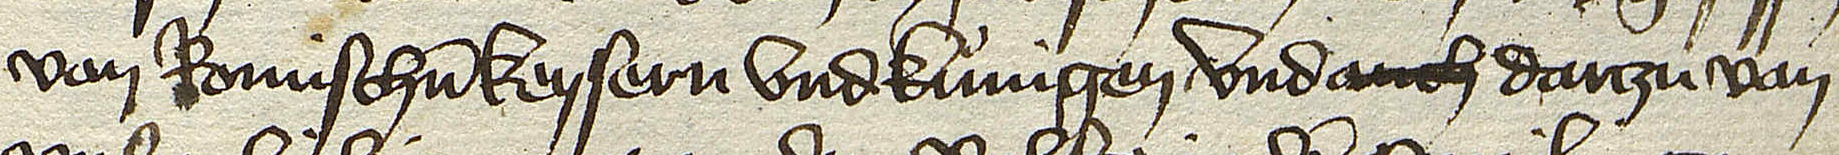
von Romiſchn* keyſern vnd künigen / Vnd auch darcʒu von
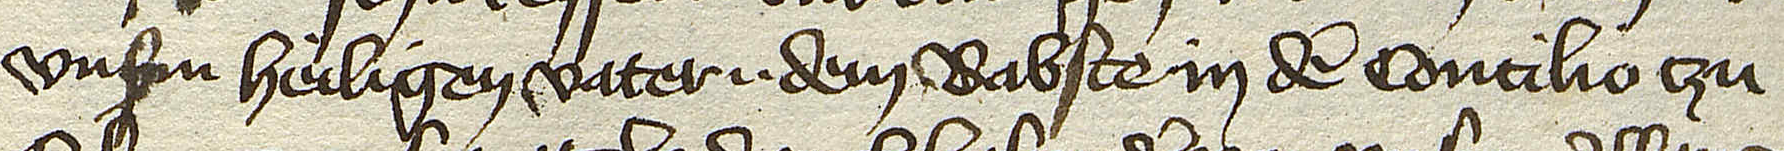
vnſ*m heiligen vater ~ dem Babſte in d* Concilio cʒu
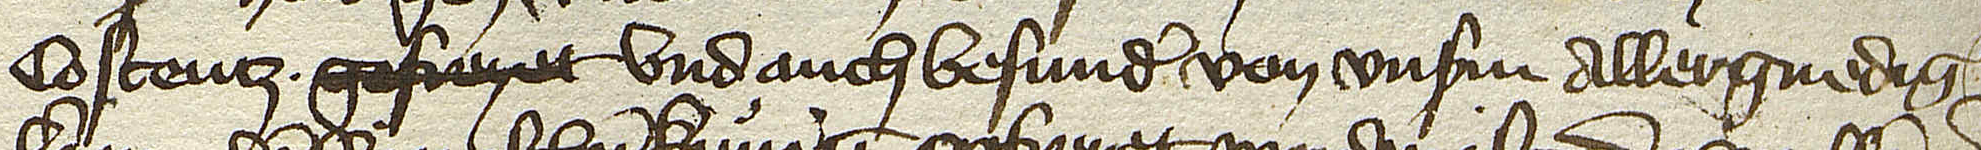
Coſtencʒ . gefreyet vnd auch beſund* von vnſ*m Allergnedig*
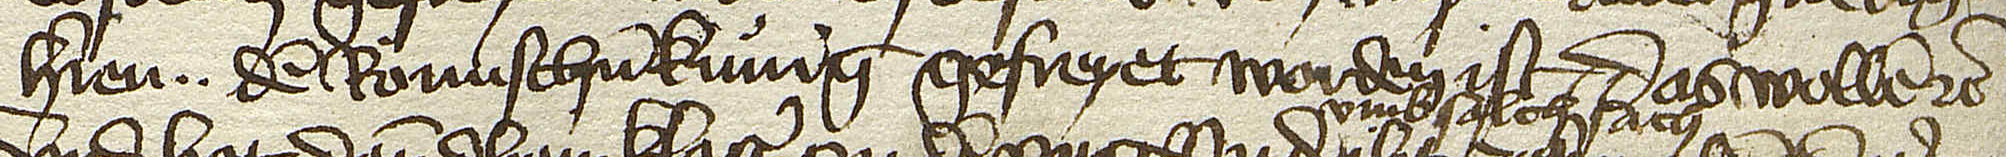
h*ren ~ d* Römiſchn* künig gefreyet worden iſ / Das wolle* ec*
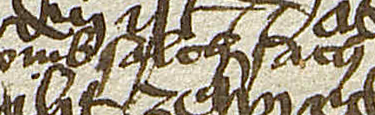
vmb ſolch ſach
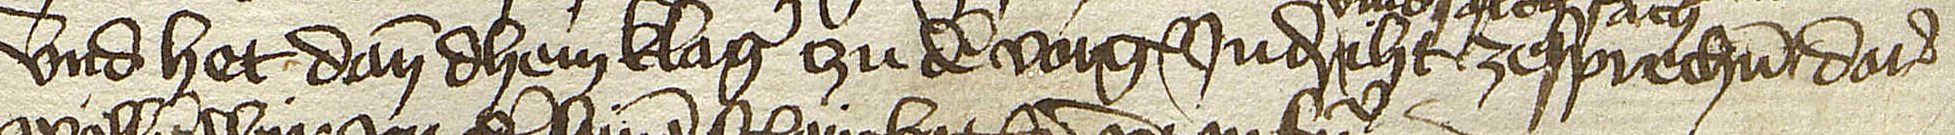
Vnd het dan* dhein klag* cʒu d* vorg* Iud* iht cʒeſprechn* / Dar*
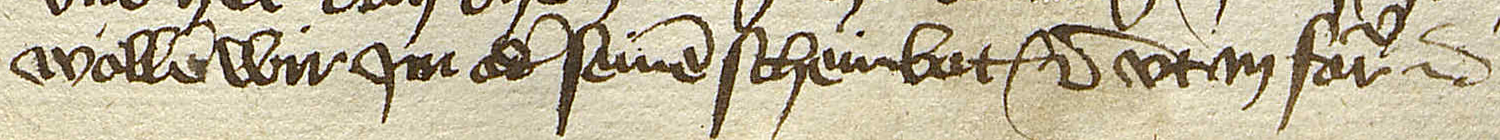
wölle* wir Im od* ſeine* ſcheimbot* ec* vt in for* ec*
